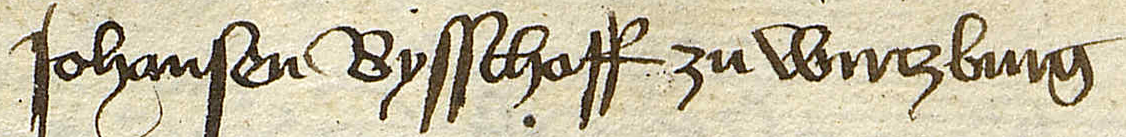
Iohanſen Byſſchoff ʒu Wircʒburg
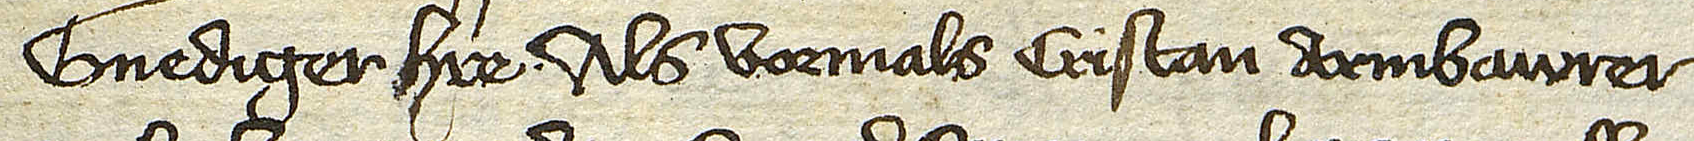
Gnediger h*re . Als vormals Criſtan Armbawrer
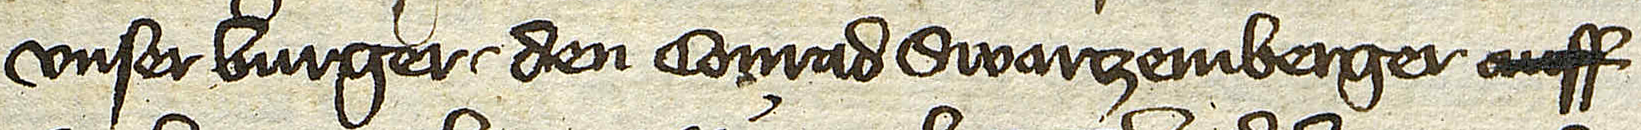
vnſer burger / den Conrad Swarcʒemberger auff
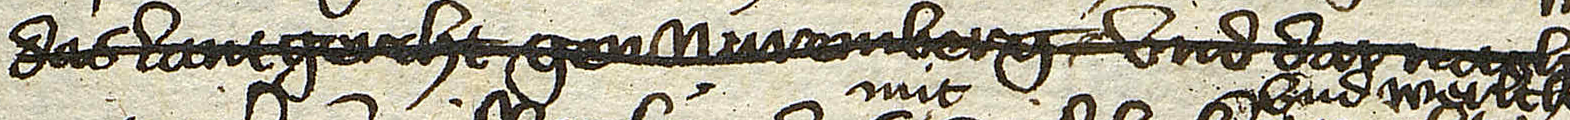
das lantgeriht gen Nüremberg / vnd darnach
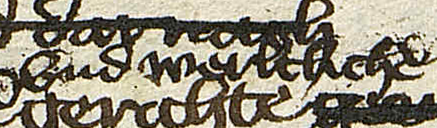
vnd werltliche*
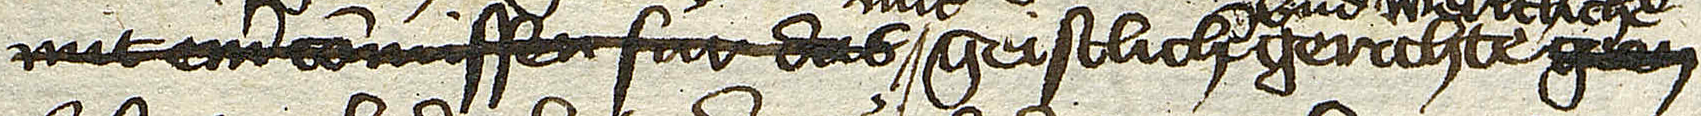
mit ein*co*miſſen für das geiſtliche* gerichte geen
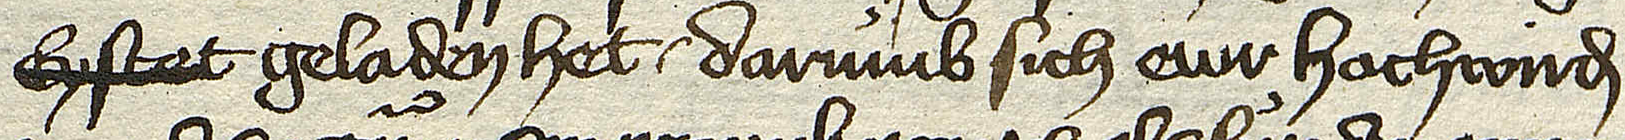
Eyſtet geladen het / darümb ſich ewr hochwird*
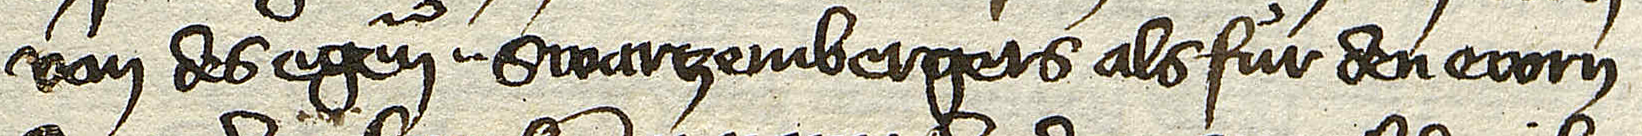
von des egen* ~ Swarcʒembergers als für den ewrn
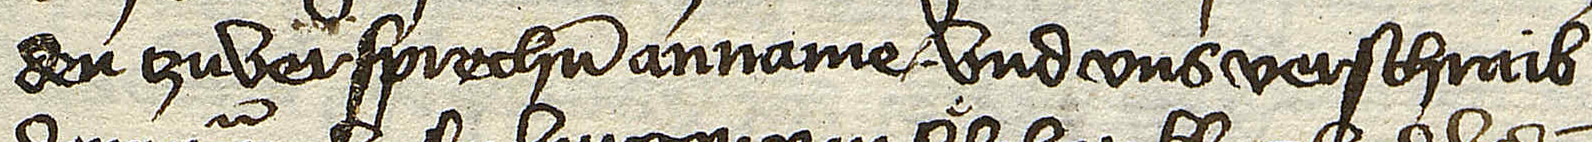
den cʒu Verſprech*n anname . Vnd vns verſchraib
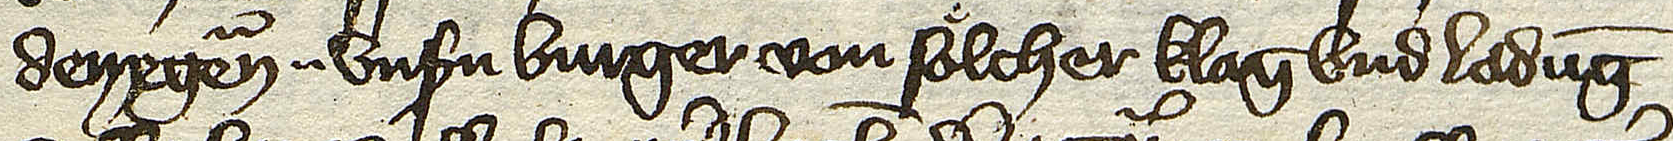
den egen* ~ vnſ*n burger von ſölcher klag vnd ladu*g
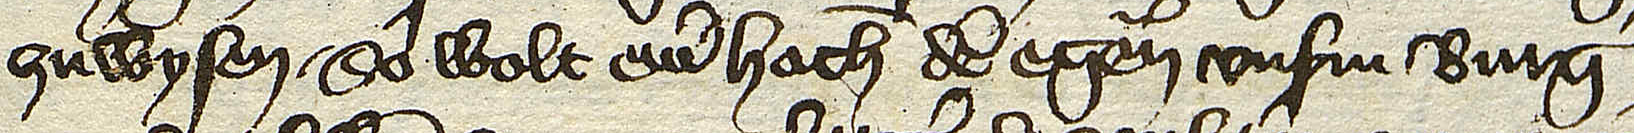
cʒu wyſen / So wolt ew* hoch* de* egen* vnſ*m Burg*
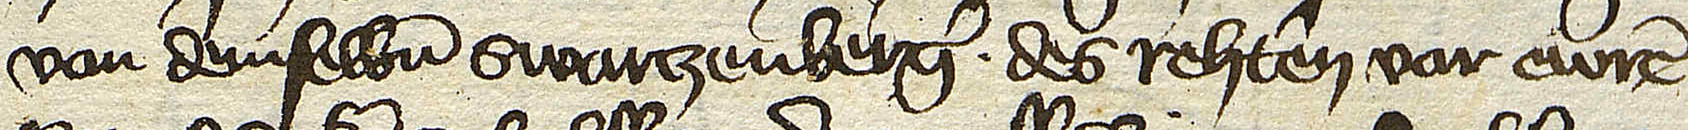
von demſelb*n Swarcʒemberg* . des rehten vor ewre*
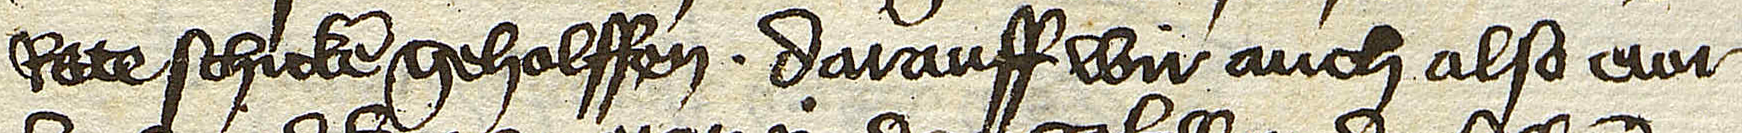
Rete ſchicke* geholffen . darauff wir auch alſo ewr*
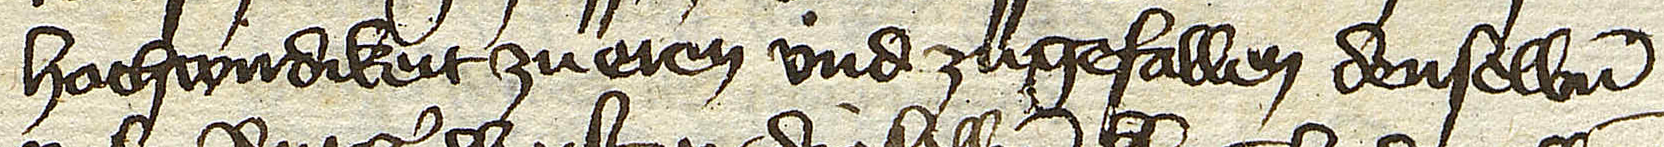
hochwirdikeit cʒu eren vnd ʒu gefallen denſelb*n
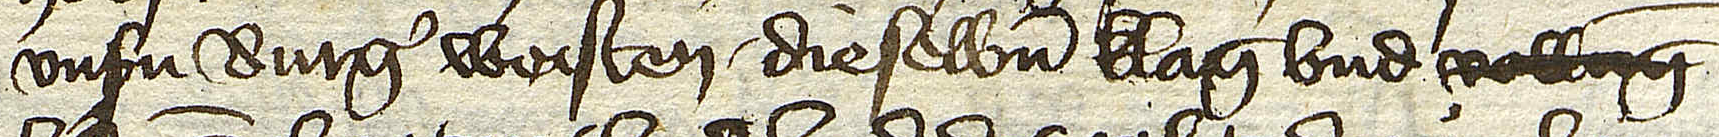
vnſ*n Burg* weiſten / dieſelb*n klag vnd vollug*
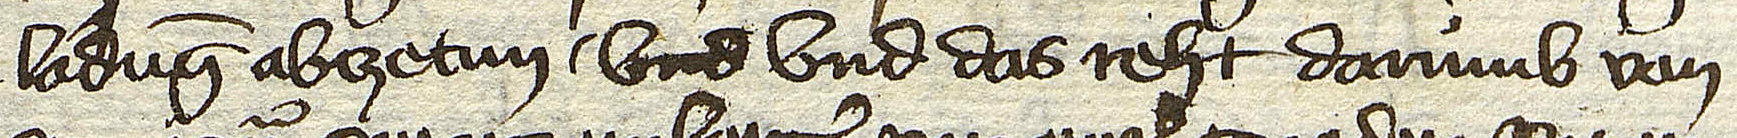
ladu*g abcʒetun / vnd vnd das reht darümb von
